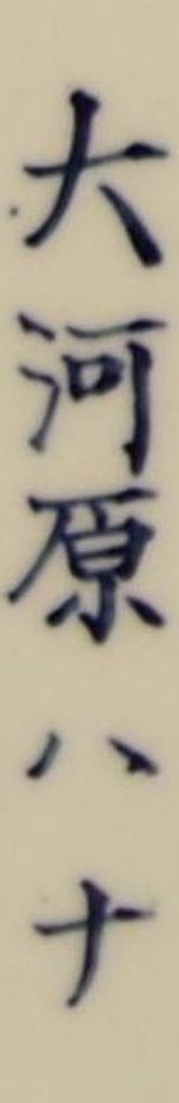大河原ハナ
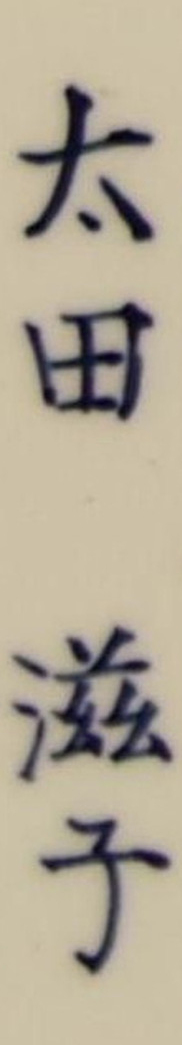太田滋子
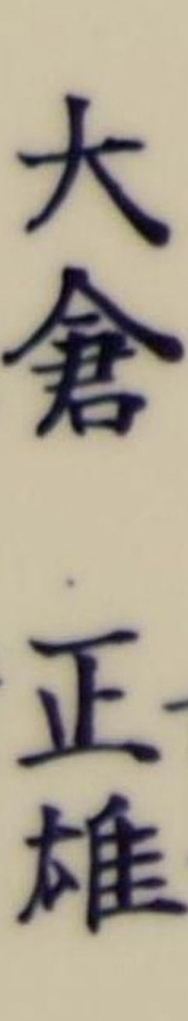大倉正雄
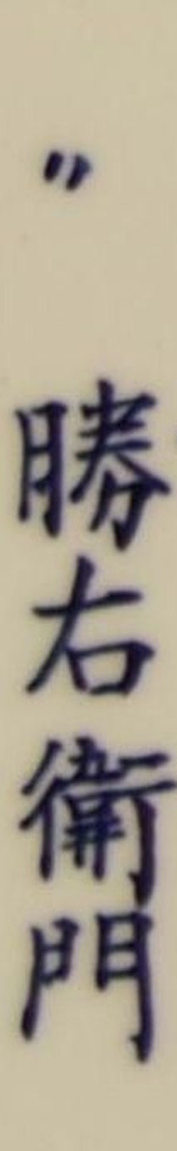勝右衛門
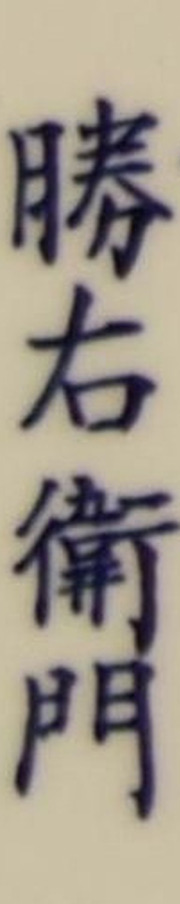勝右衛門
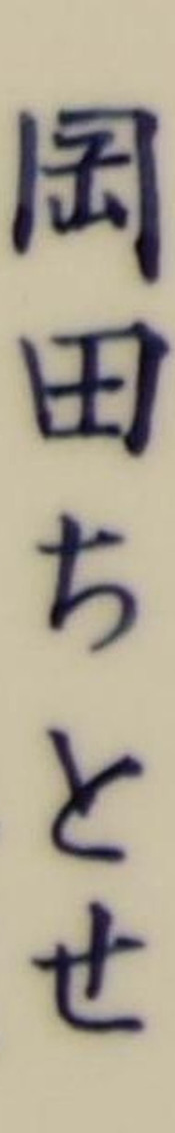岡田ちとせ

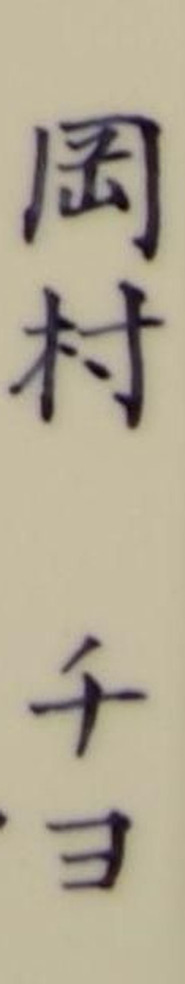岡村チヨ
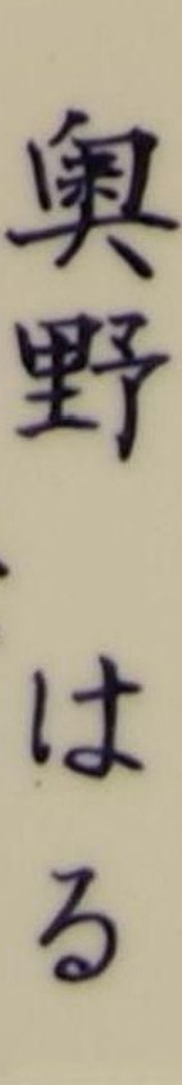奥野はる
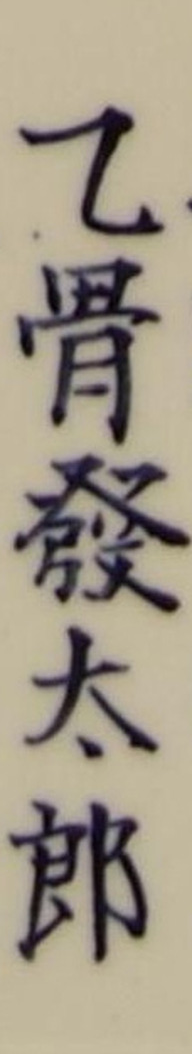乙骨発太郎
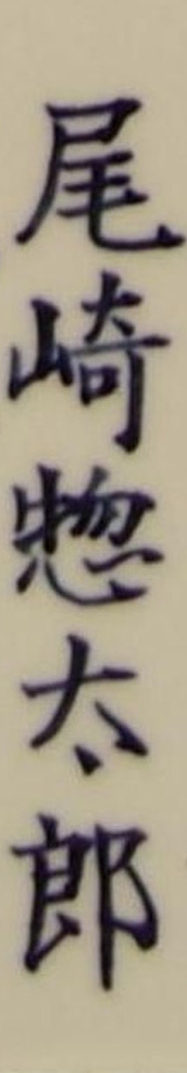尾崎惣太郎
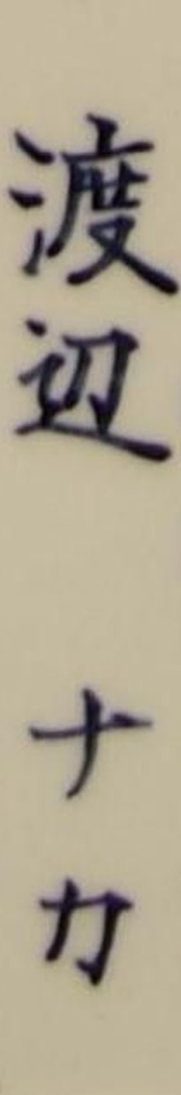渡辺ナカ
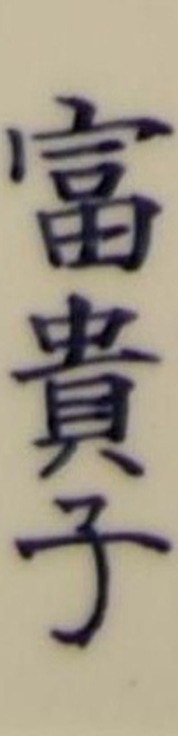富貴子
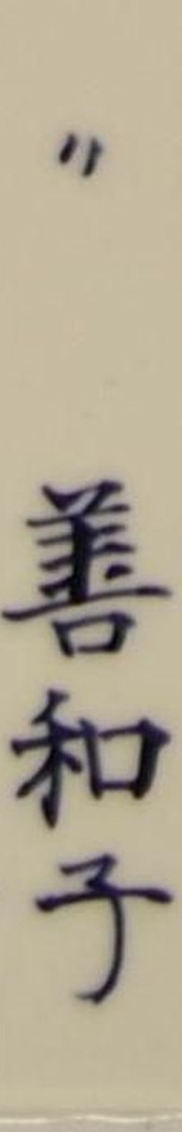善和子
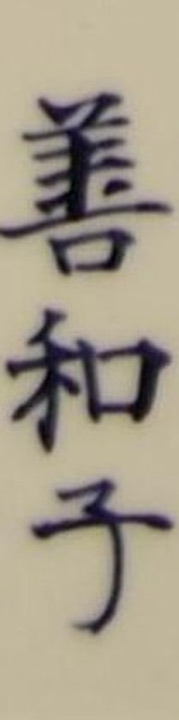善和子
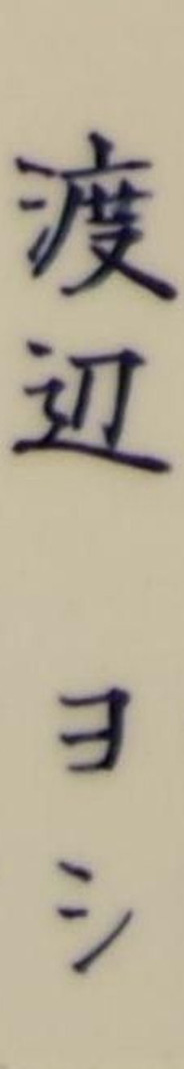渡辺ヨシ
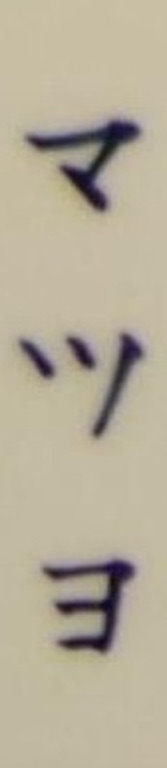マツヨ
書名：A~D
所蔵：koyasan kongobuji
